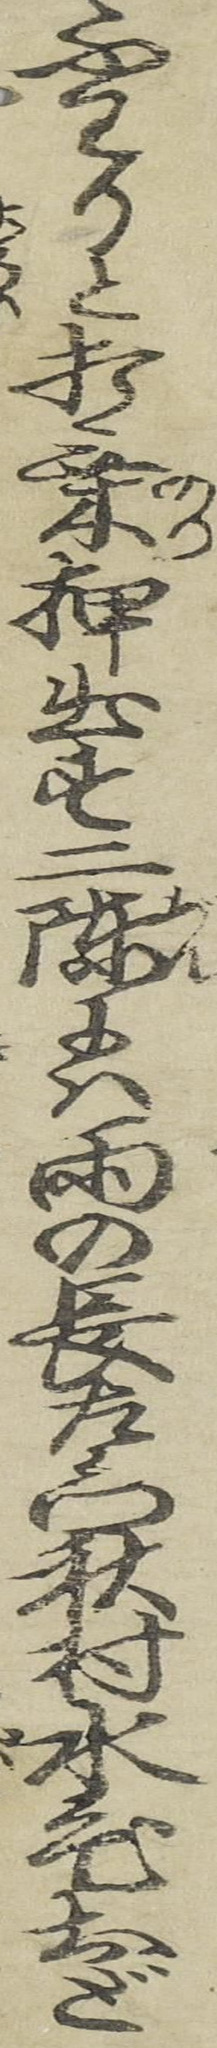ふわりと打乗押出す二陣には雨の長左衛門秋村水走おど
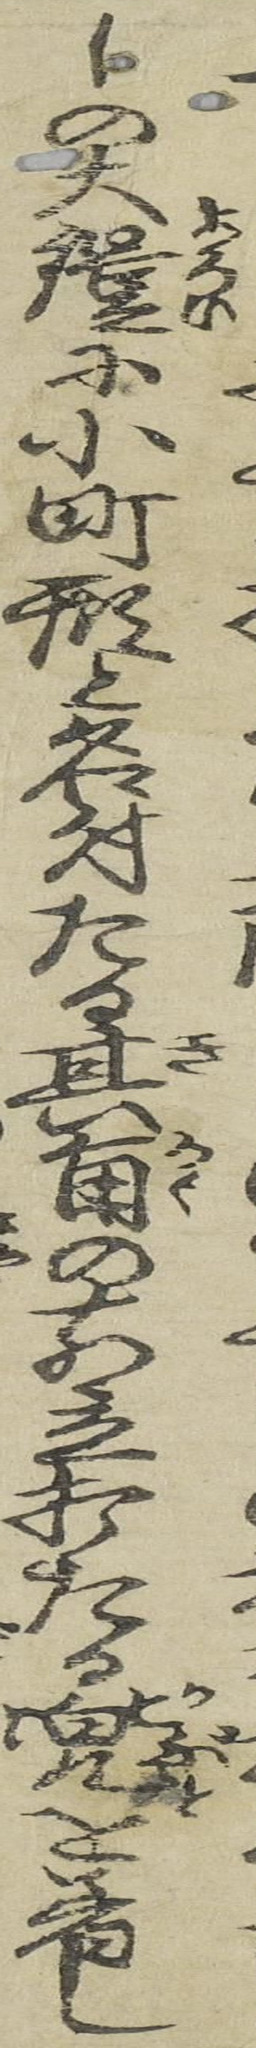しの大鎧に小町形と名付たる其角の前立打たる兜を着し
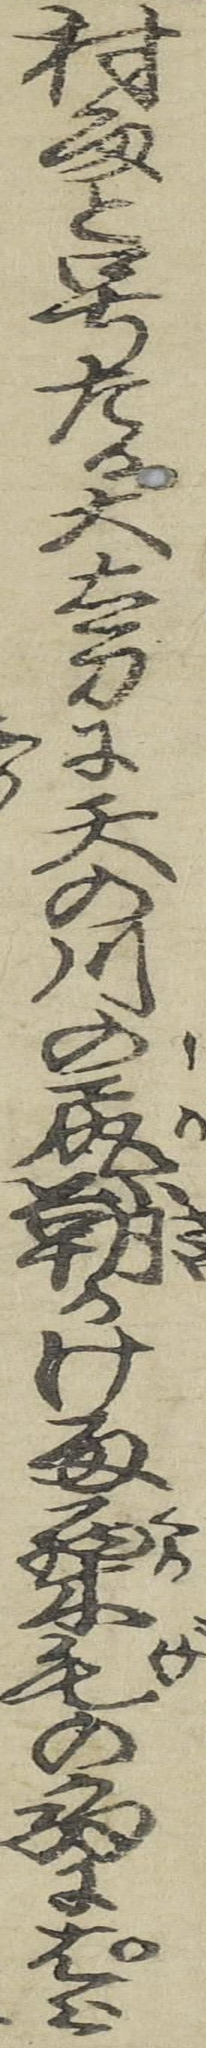村雨と号したる大太刀に天の川の尻鞘かけ雨栗毛の亀にはら
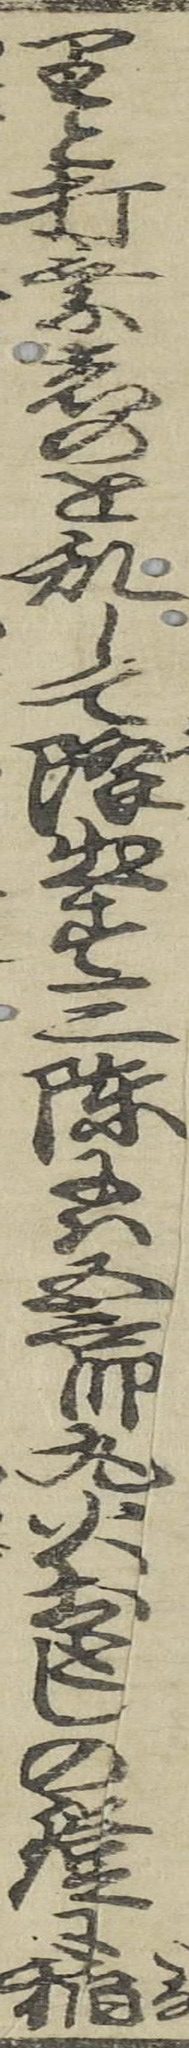りと打乗しのと乱して降出す三人には五郎丸火おとしの鎧に稲
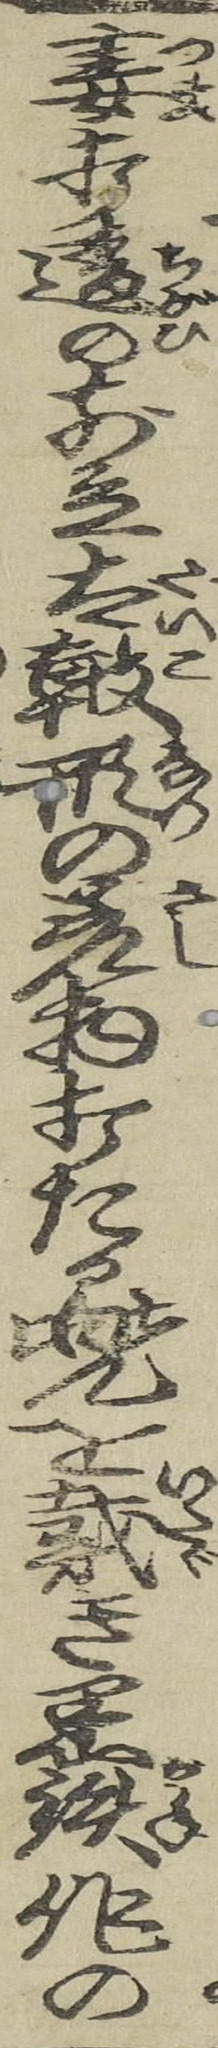妻打違の前立太皷形の差物打たる兜を戴き黒鉄作の
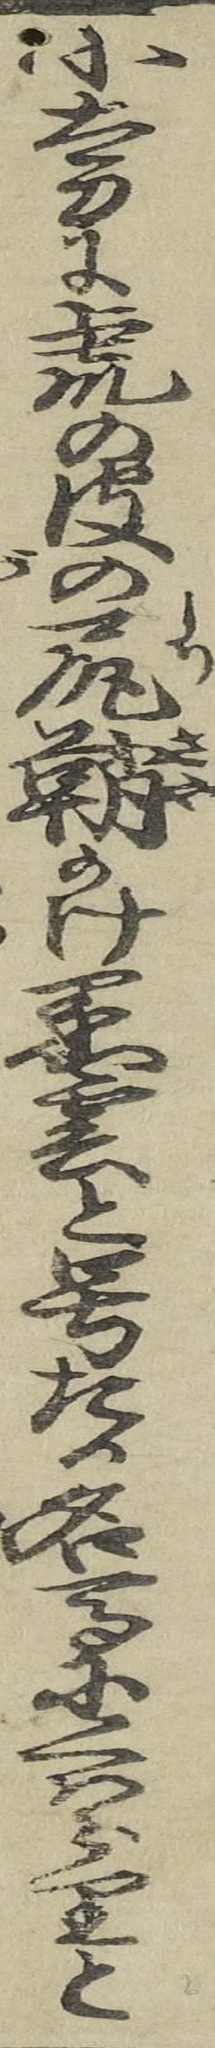小太刀に虎の皮の尻鞘かけ黒雲と号たる名馬にくはらりと
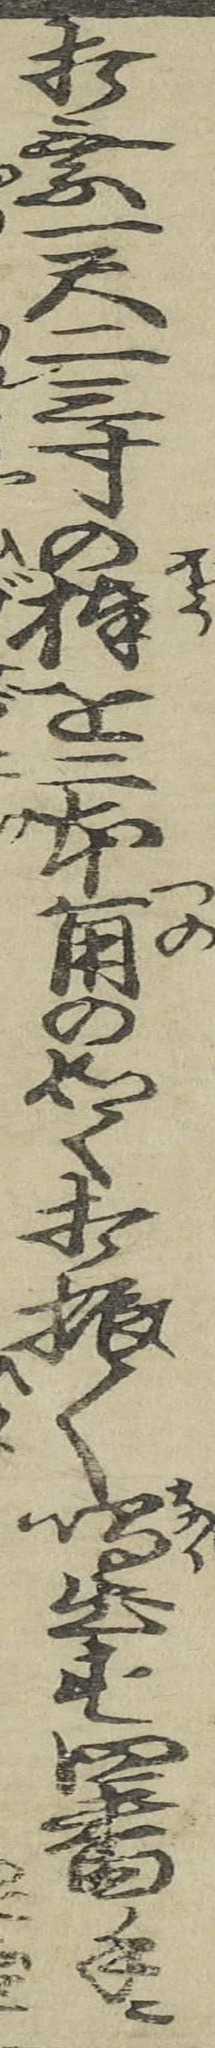打乗一尺二三寸の棒を二本角の如く相振〳〵鳴出す四番手二
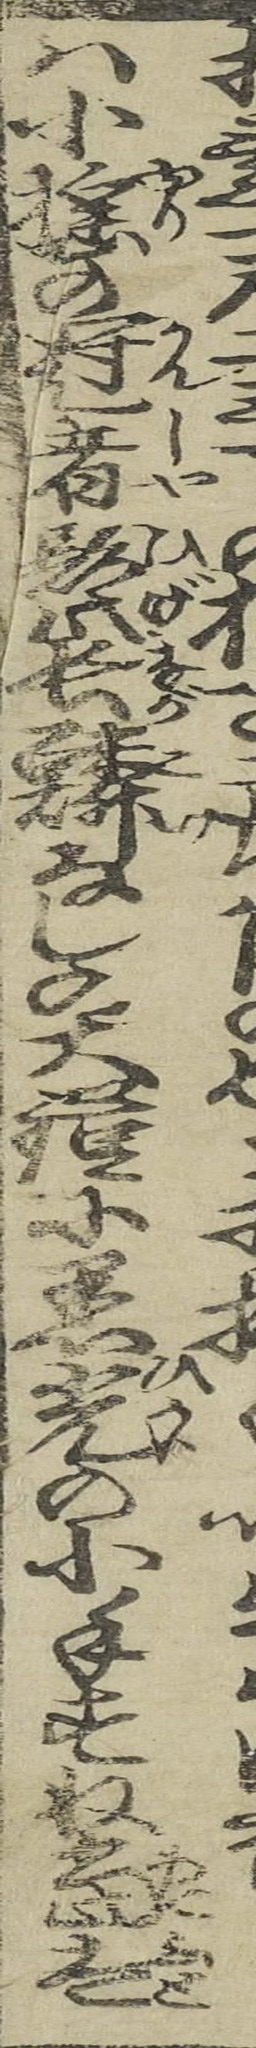は小揺の冠者髭長鱗なしの大鎧に黒光の小手すね当大
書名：安政大地震畧記　全
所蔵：東京大学地震研究所図書室 Earthquake Research Institute Library, The University of Tokyo, JAPAN
